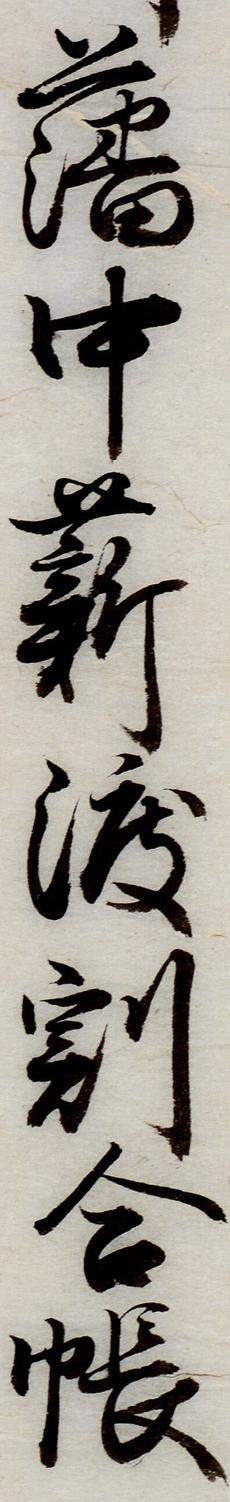御藩中薪渡割合帳
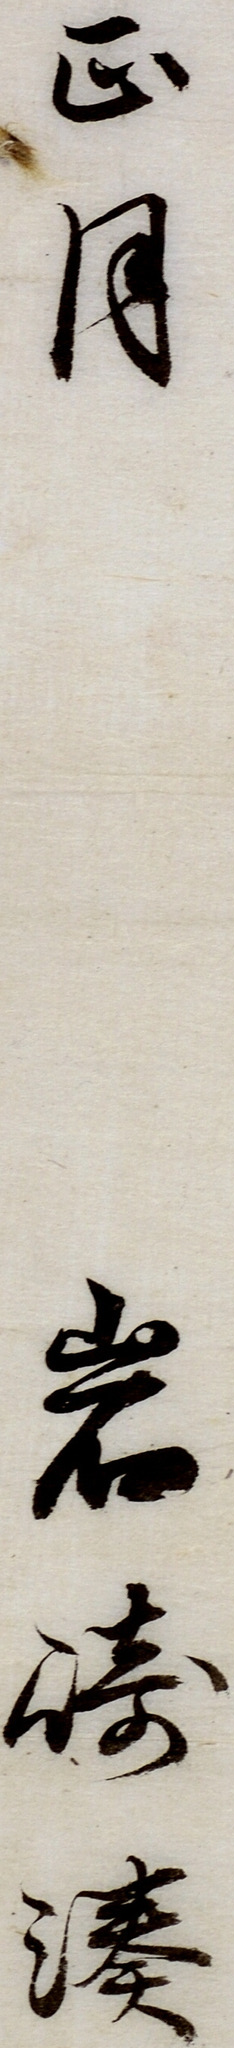正月岩崎湊

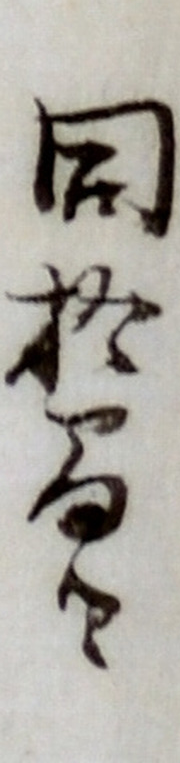同九間ツヽ
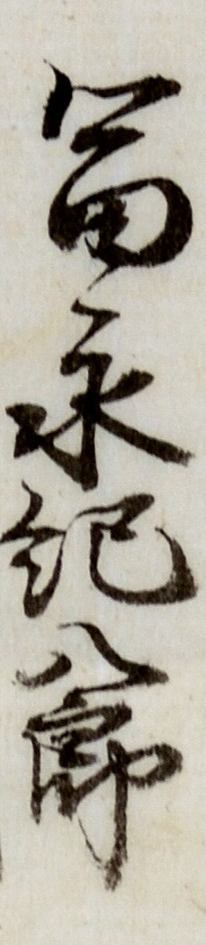冨永紀八郎
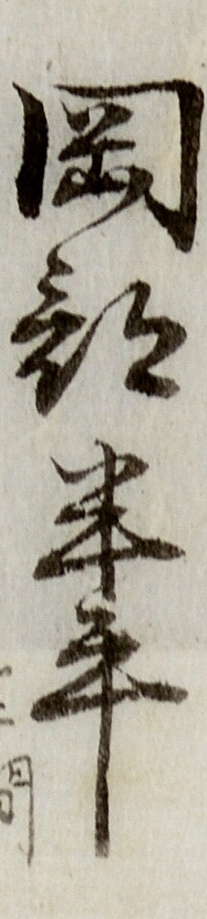岡部半平
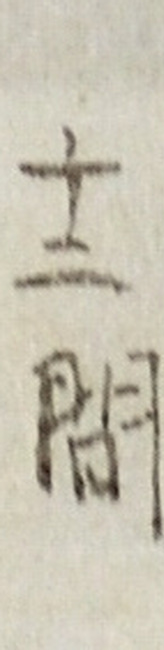十二間
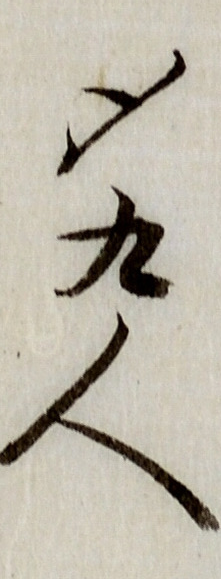〆九人
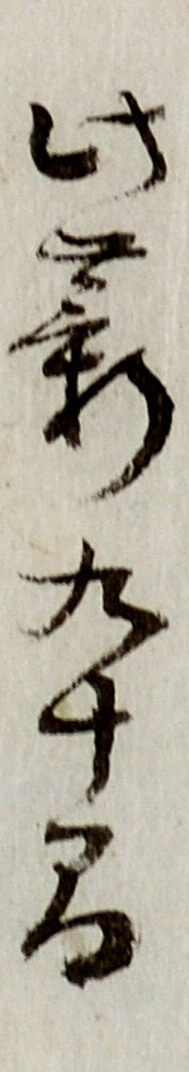此薪九十間
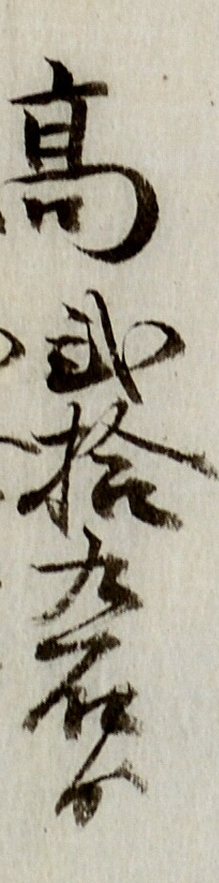高弐拾九石ゟ
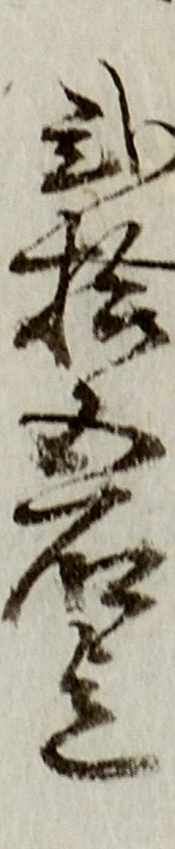弐拾五石迄
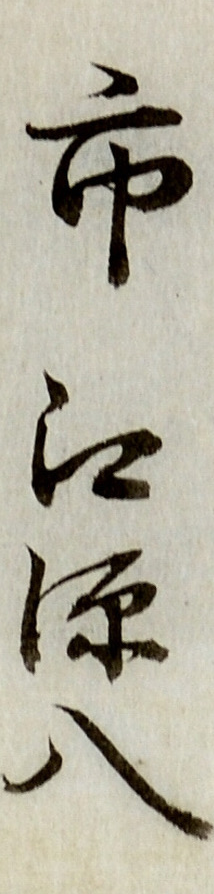市江源八
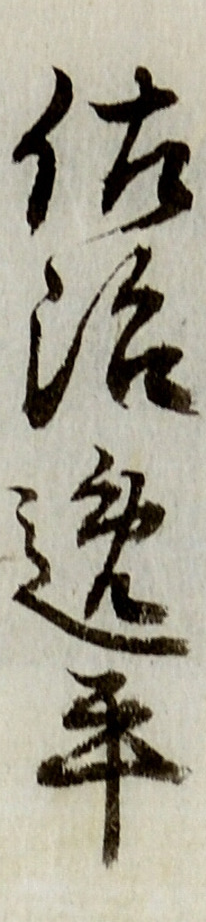佐治逸平
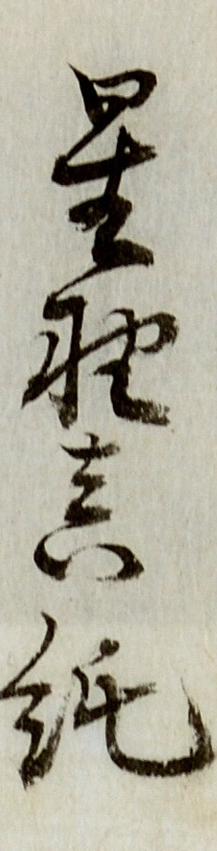星野真純
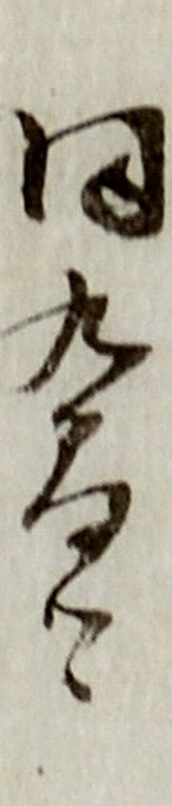同九間ツヽ
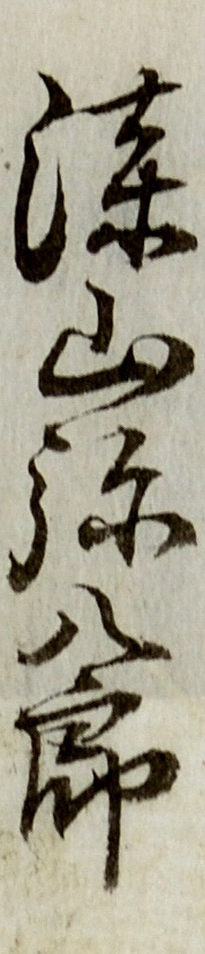深山弥八郎
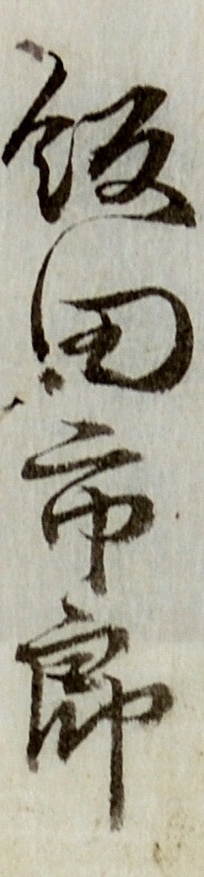飯田市郎
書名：御藩中薪渡割合帳
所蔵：伊那市立高遠町図書館・合同会社AMANE
